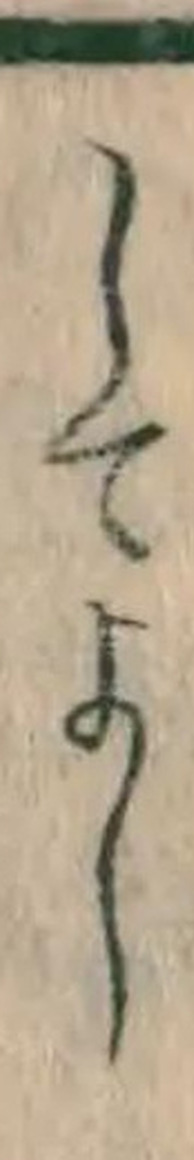してよし
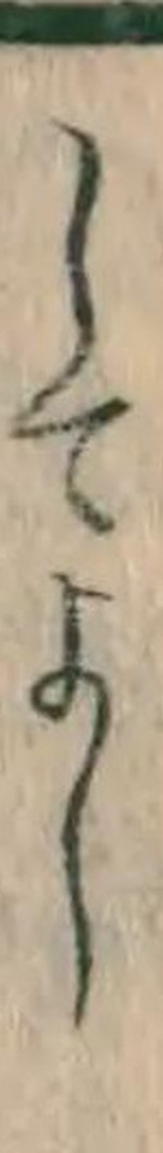してよし
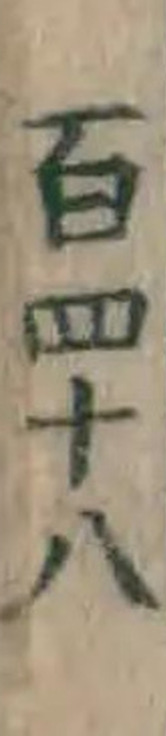百四十八

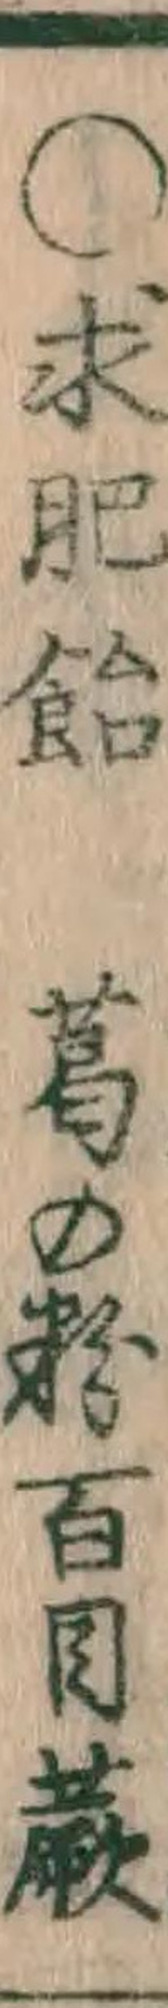○求肥飴葛の粉百目蕨
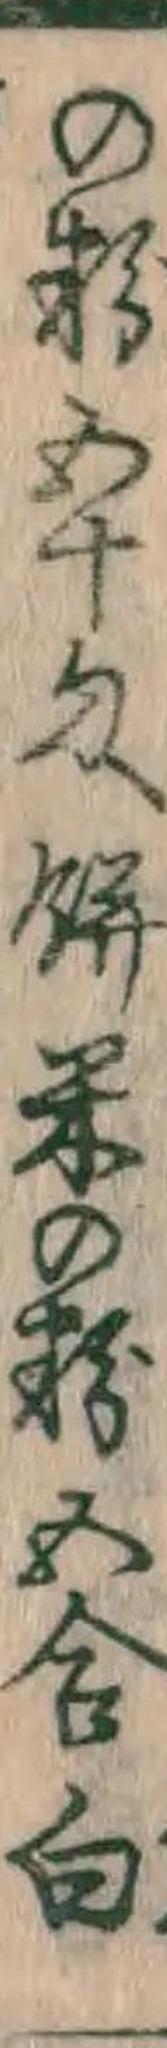の粉五十匁餅米の粉五合白
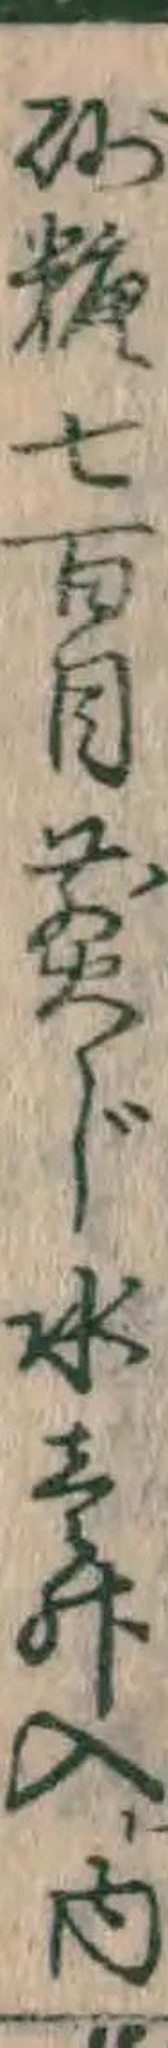砂糖七百目煎じ水壱升入れ内
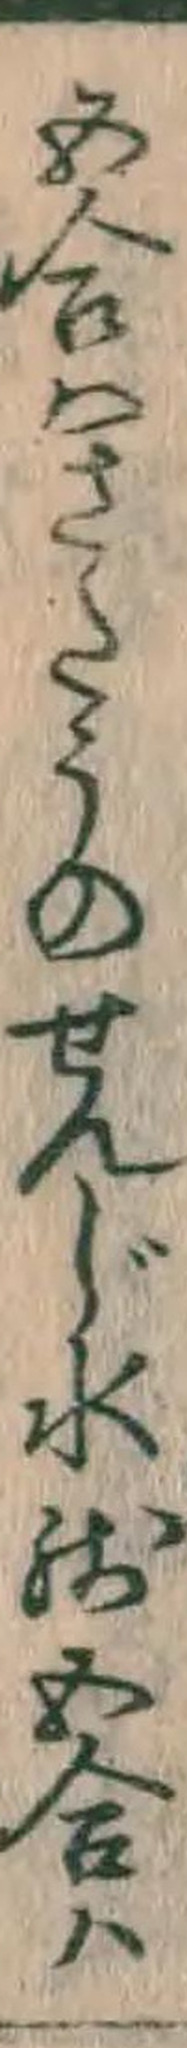五合はさたうのせんじ水残五合は
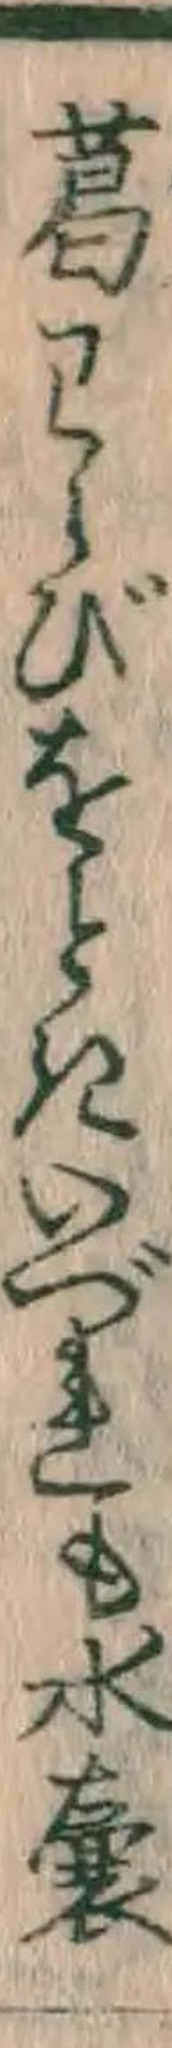葛わらびをときいづれも水嚢
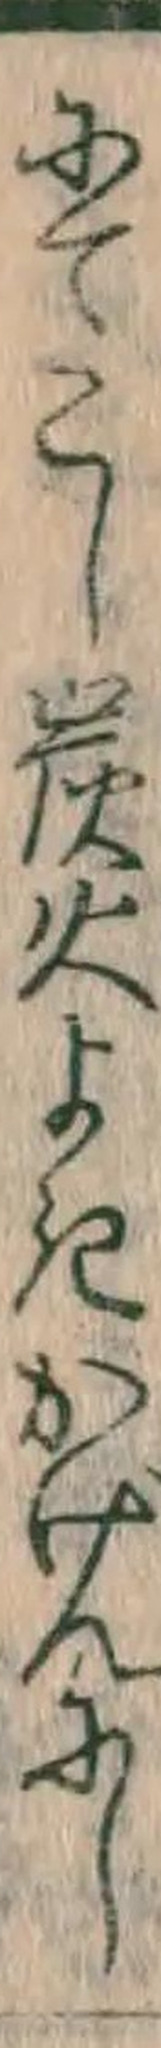にてこし炭火よきかげんにし
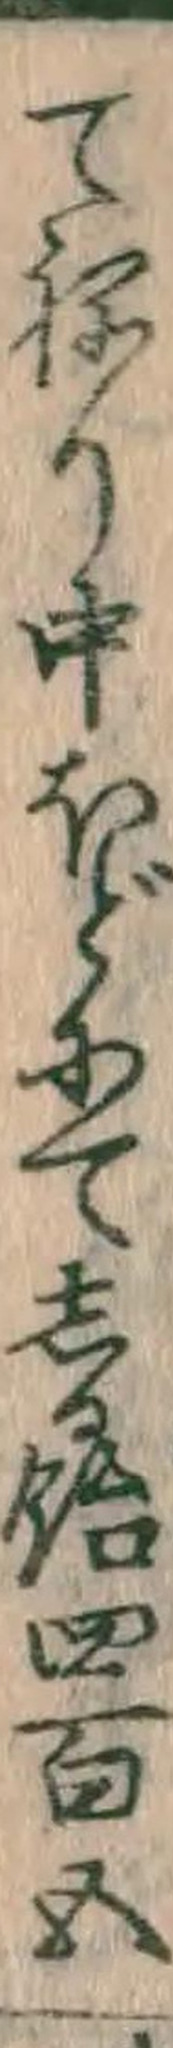てねり中ほどにてしる飴四百五
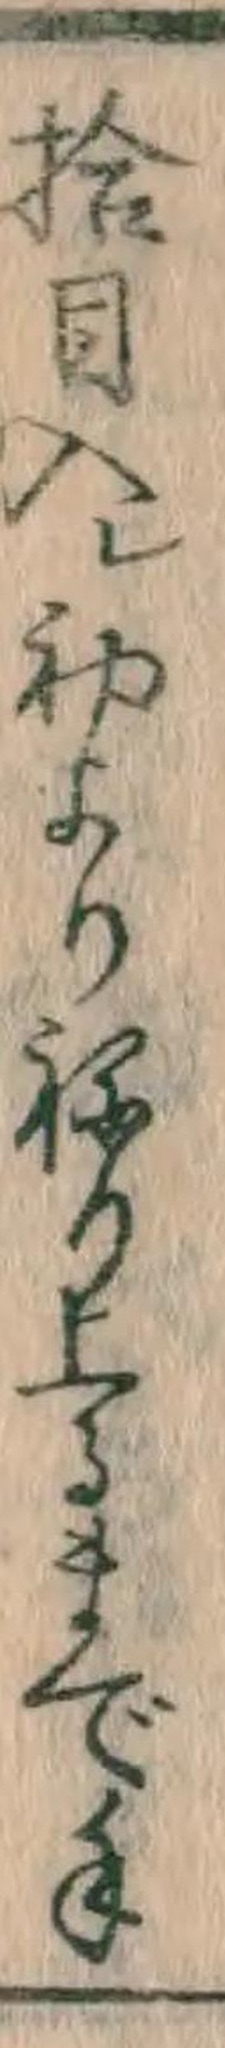拾目入れ初よりねり上るまで手
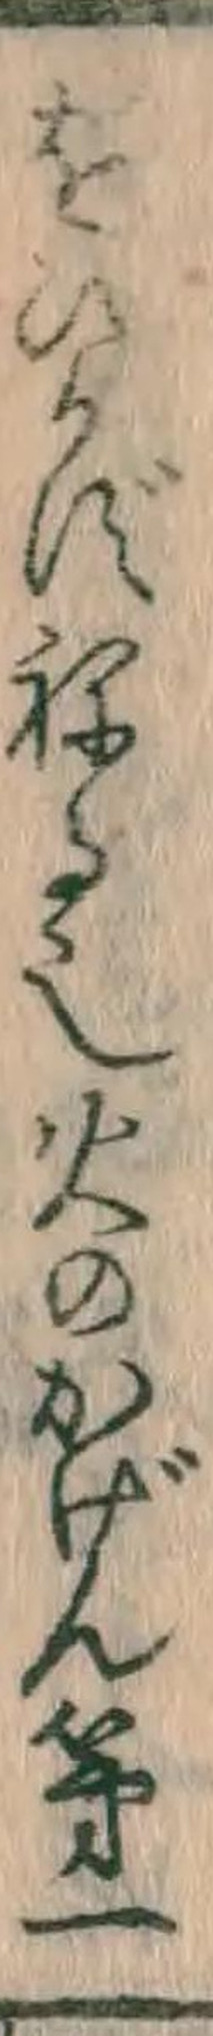をひかずねる也火のかげん第一
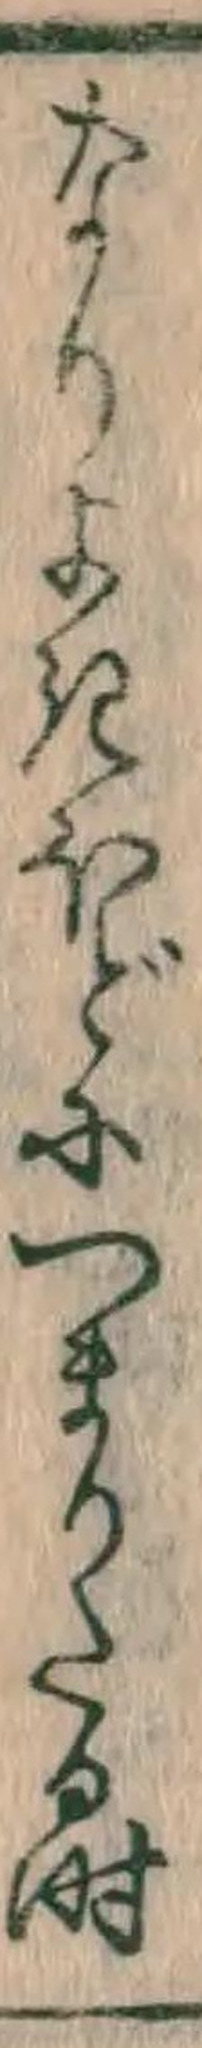なりよきほどにつまりたる時
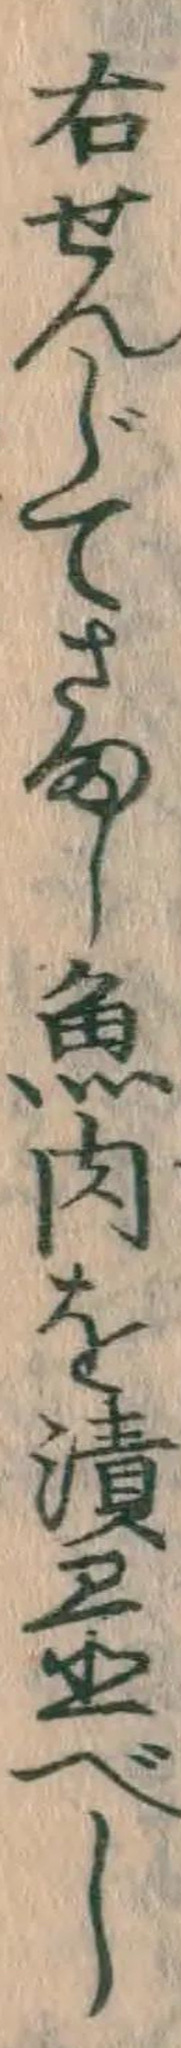右せんじてさまし魚肉を漬置べし
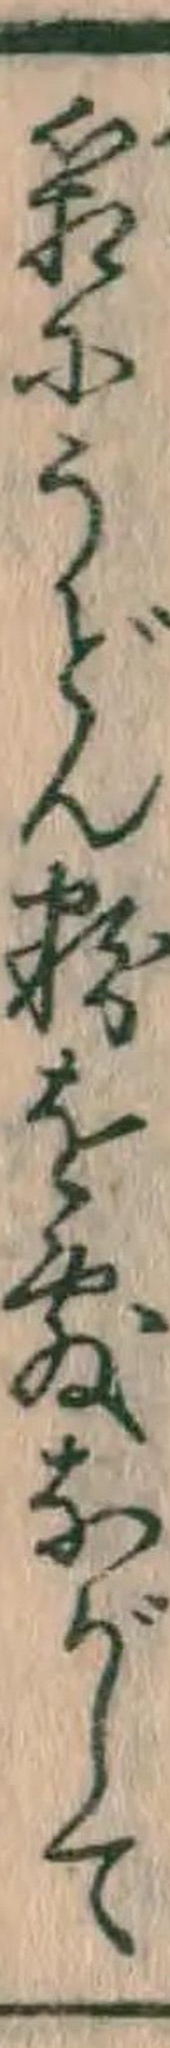箱にうどん粉を敷ながして
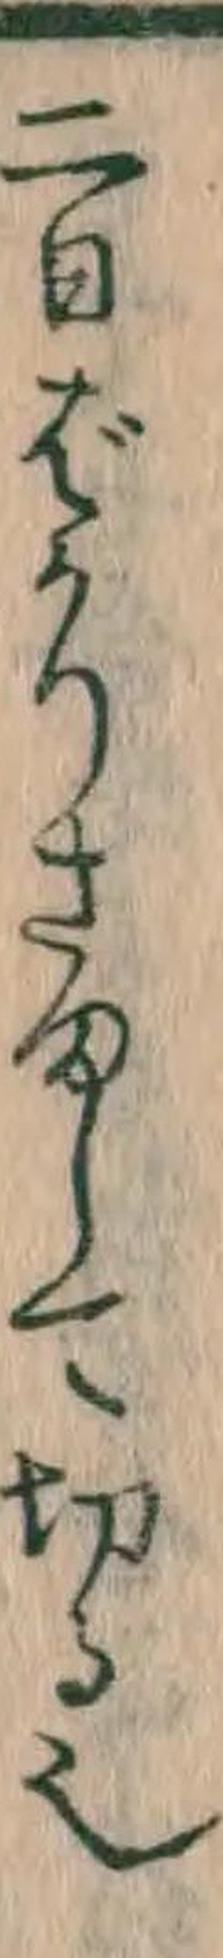二日ばかりさまして切る也
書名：広益秘事大全 3巻. [5]
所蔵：国立国会図書館 National Diet Library, JAPAN
